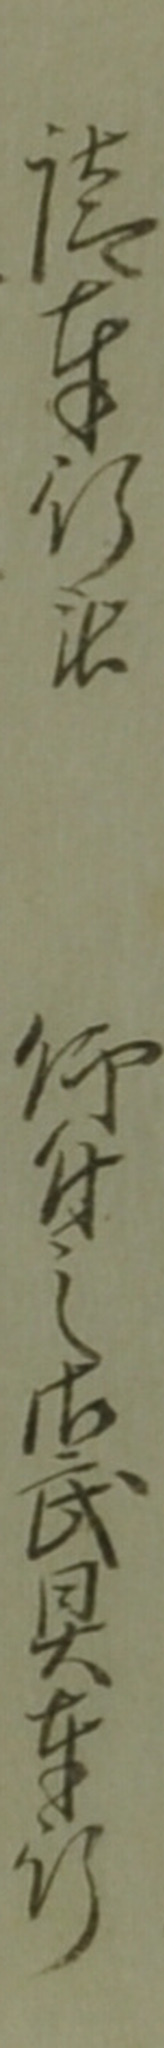請奉行被仰付之御武具奉行
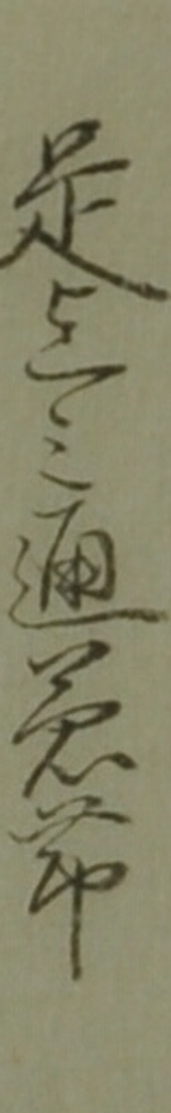是迄之通兼帯
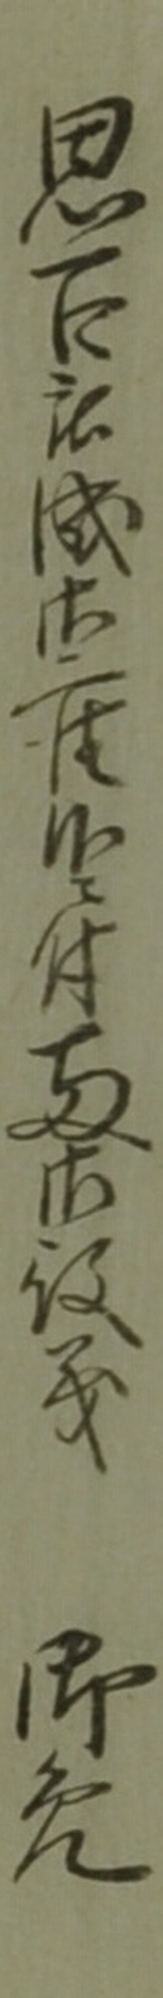思召被成御座候ニ付両御役義御免
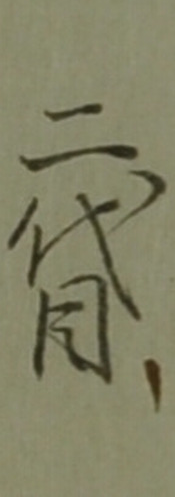二代目
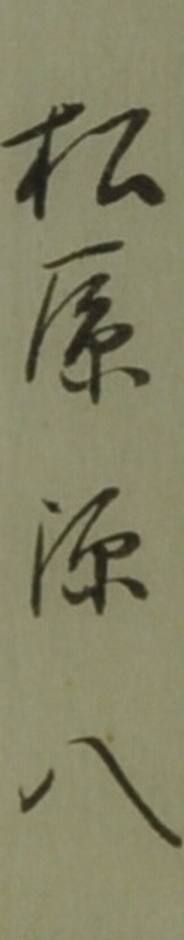松原源八
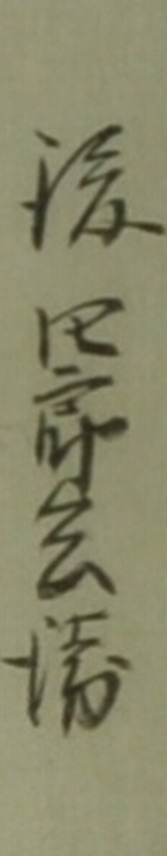後四郎兵衛

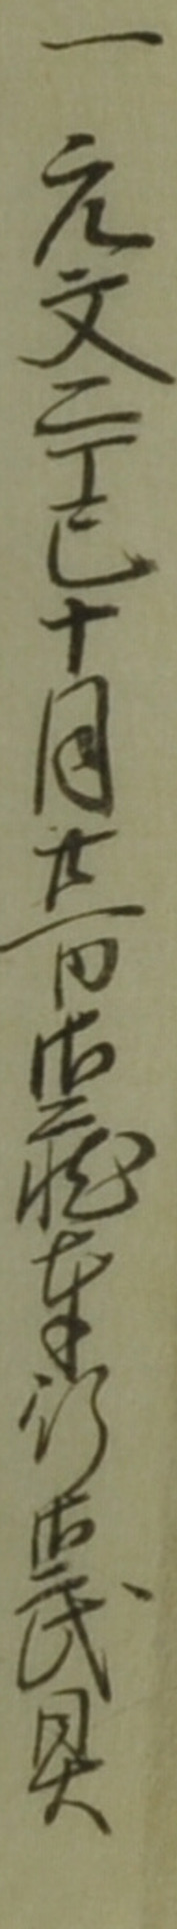一元文二丁巳十月廿一日御蔵奉行御武具
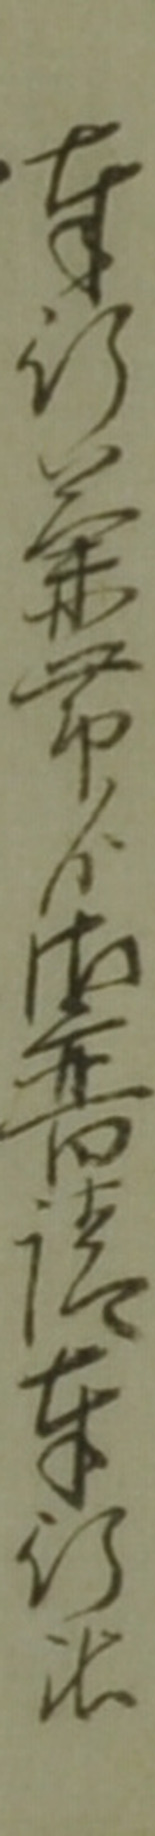奉行兼帯ゟ御普請奉行被
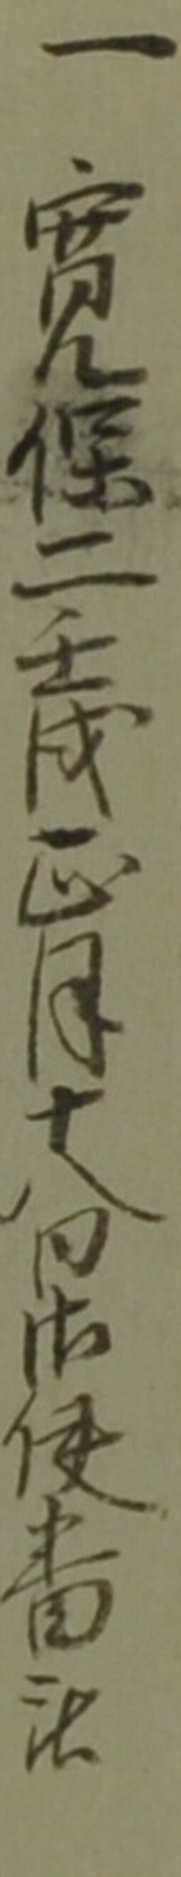一寛保二壬戌正月十八日御使番被
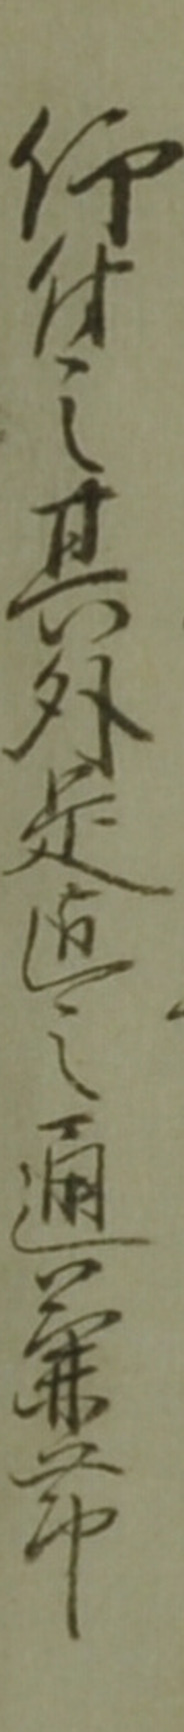仰付之其外是迄之通兼帯
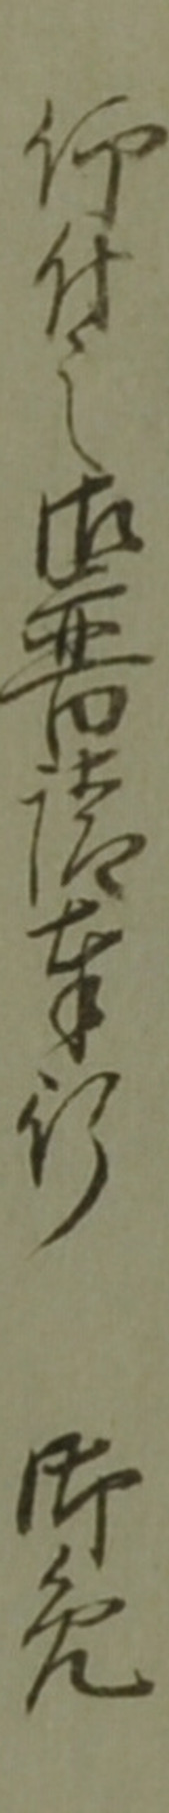仰付之御普請奉行御免
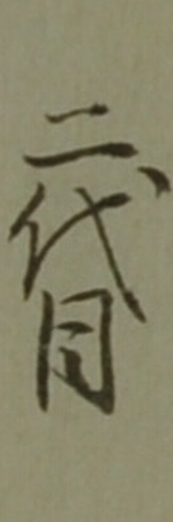二代目
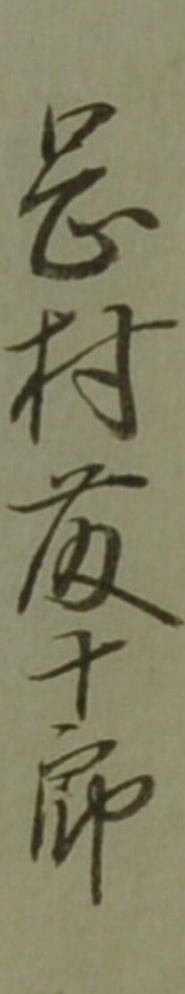岡村藤十郎
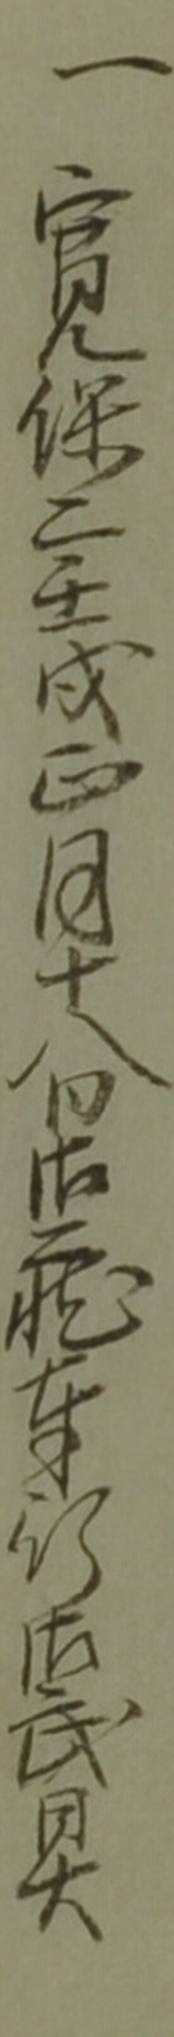一寛保二壬戌正月十八日御蔵奉行御武具
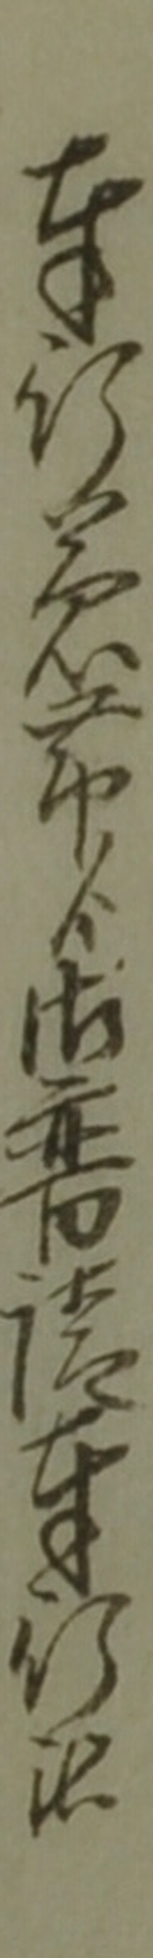奉行兼帯ゟ御普請奉行被
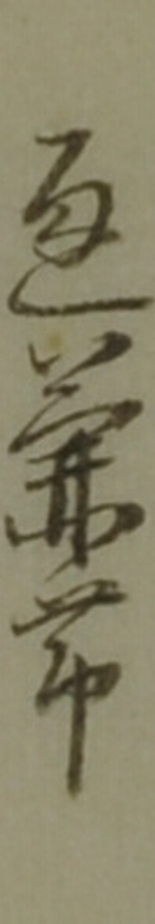通兼帯
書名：諸御役代々録（六）
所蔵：伊那市立高遠町図書館・合同会社AMANE
